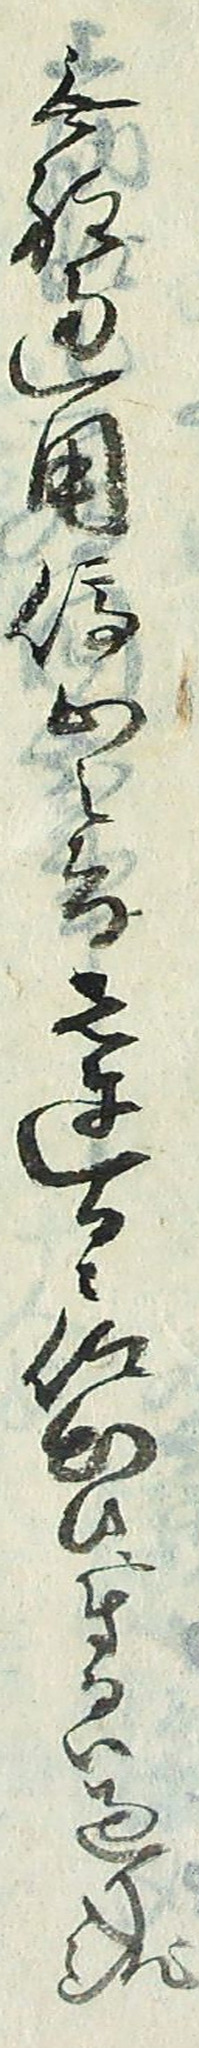無程通用停止之旨先達而被仰出候に付ては通用銀
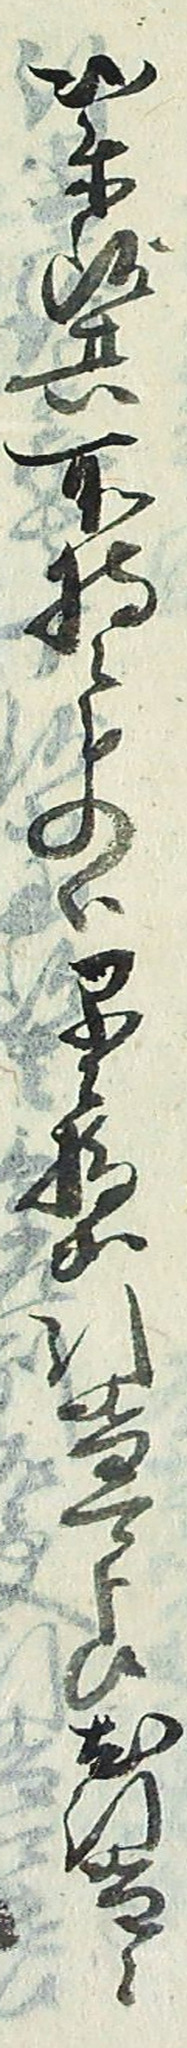弐朱銀共所持之ものは早々指出引替可申候尤引替に
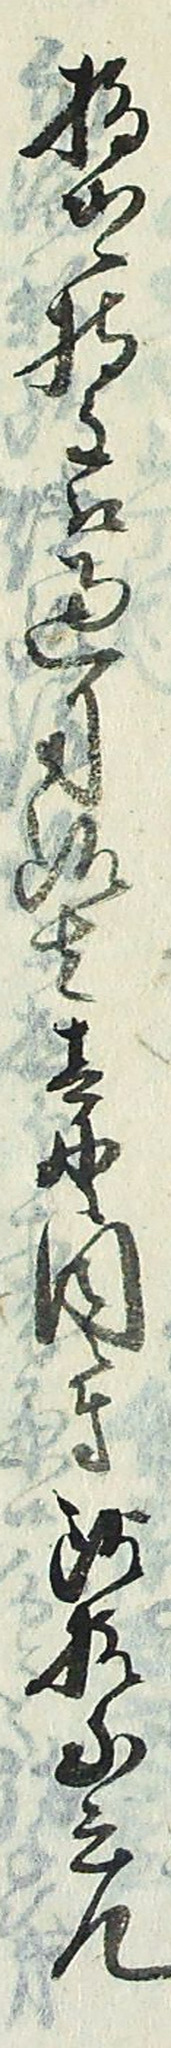指出候持主江通用銀は壱貫目に付銀拾匁充
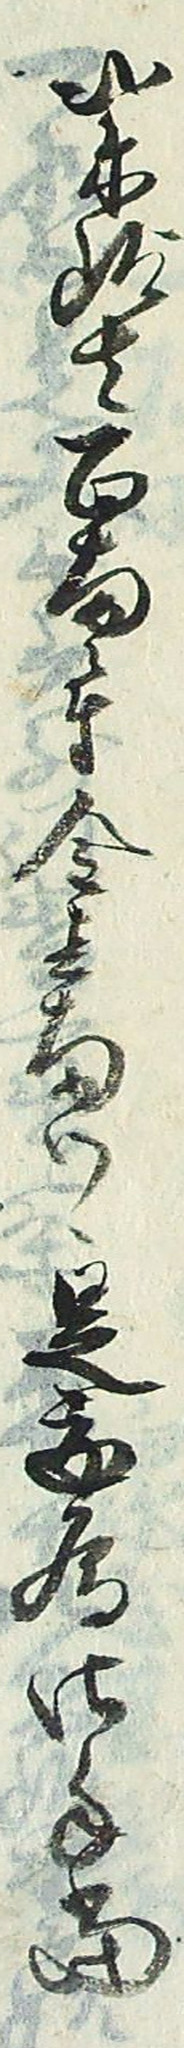弐朱銀は百両に付金壱両つゝ是亦為御手当
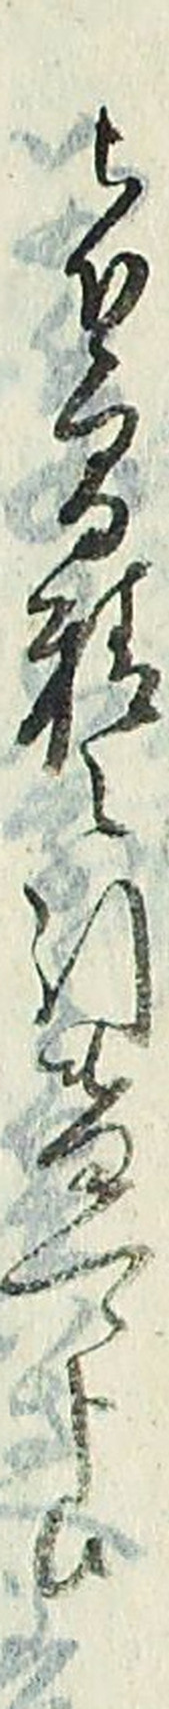被下候間精々引替可申候
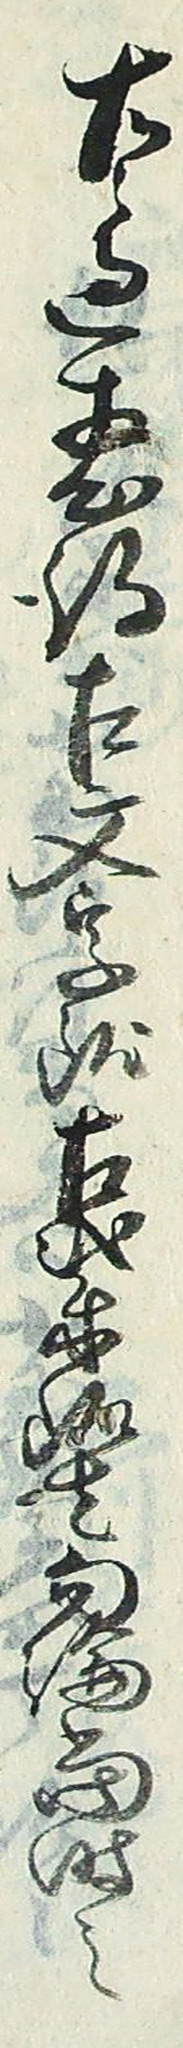右之通相心得古文字銀古弐朱銀は勿論当時之

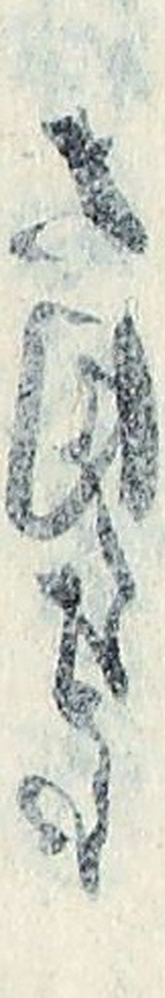十二月
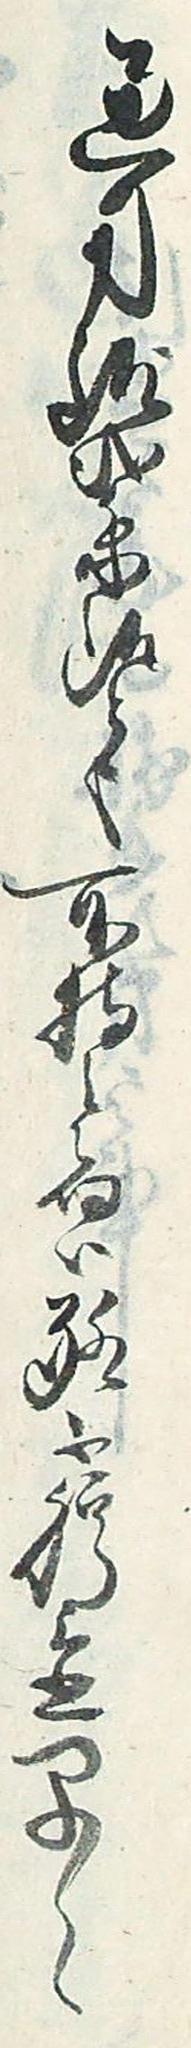通用銀弐朱銀とも所持之者は聊不貯置早々
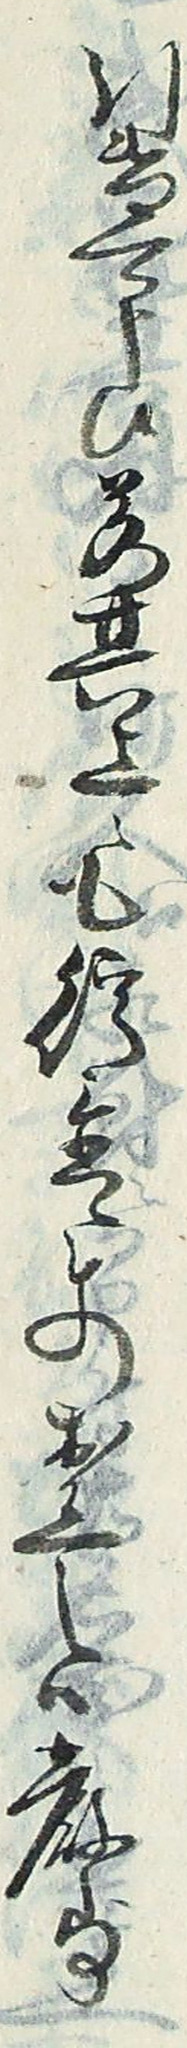引替可申候若其上にも貯置候もの於有之は厳布
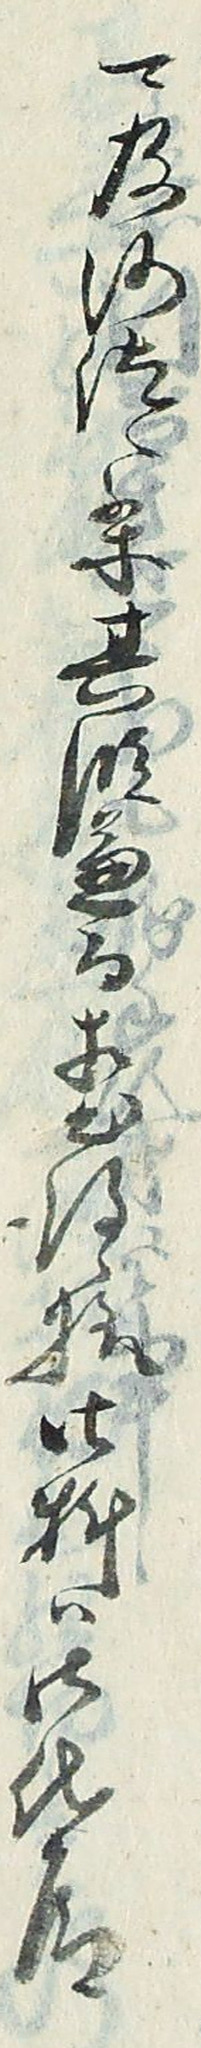可及沙汰候条其段兼て相心得候様御料は御代官
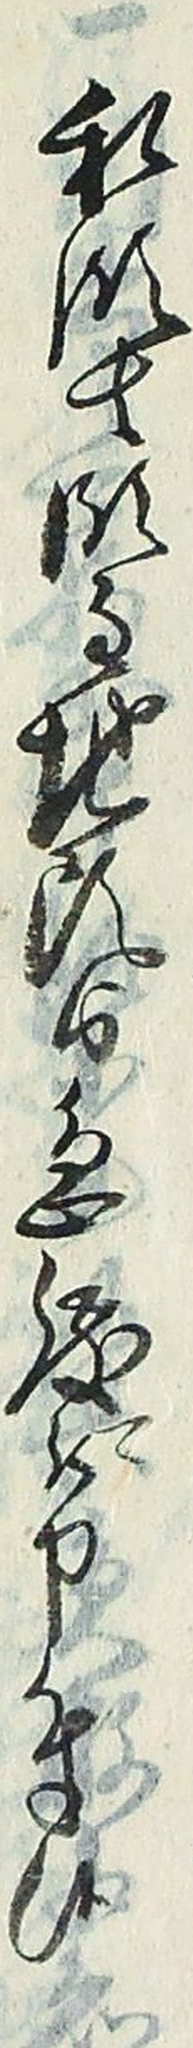私領は領主地頭ゟ急度可被申付候
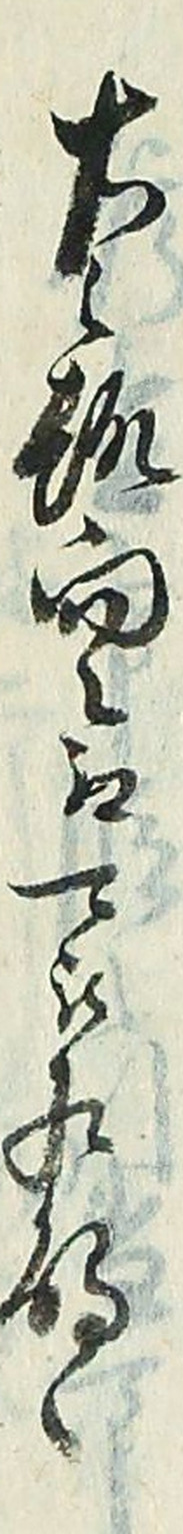右之趣向々江可被相触候
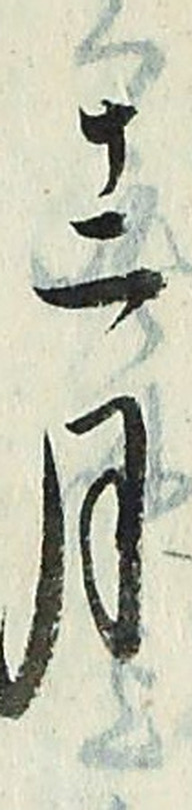十二月
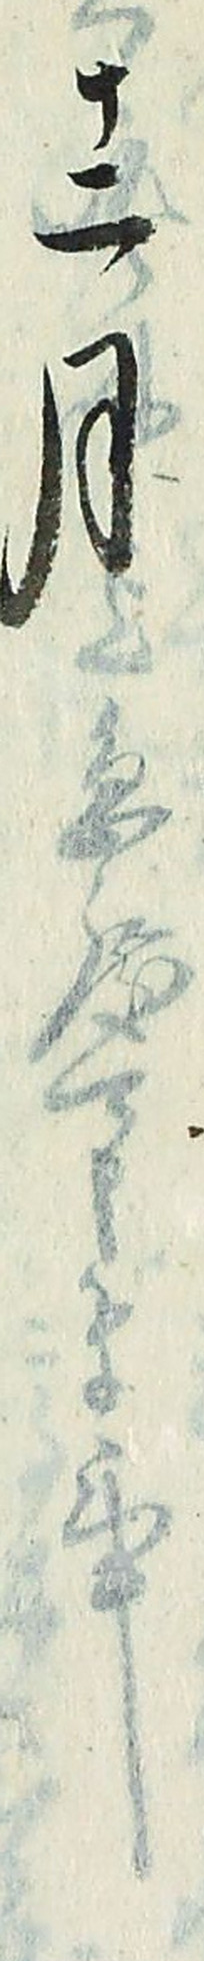十二月
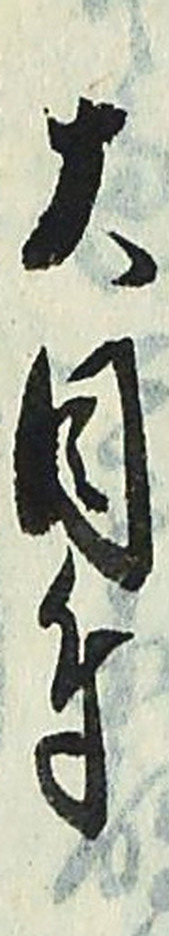大目付
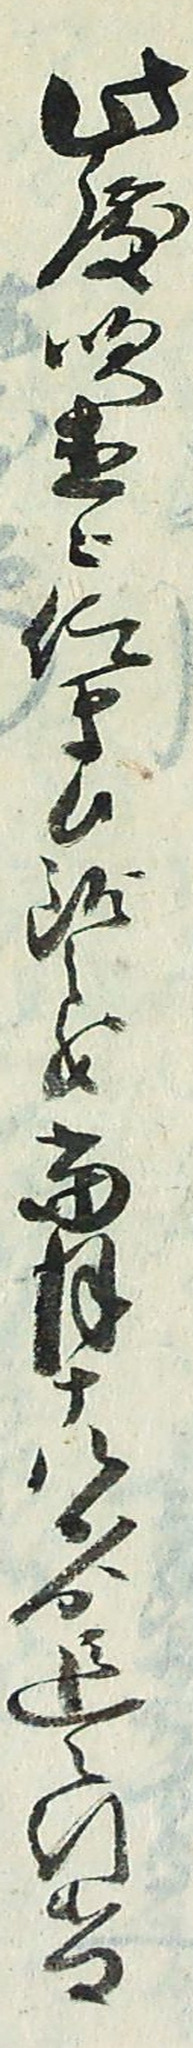此度吹直被仰付候銀之義当月十八日ゟ追々引替
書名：諸御用御□受書控
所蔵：鳴門教育大学 Naruto University of Education
